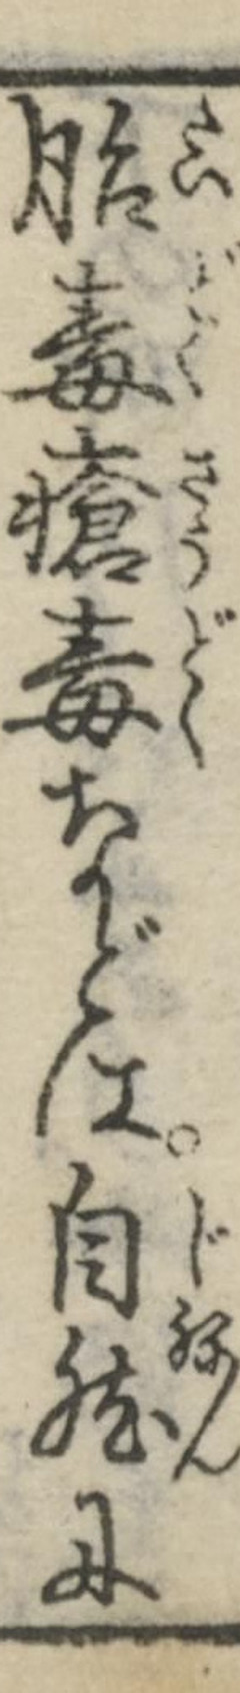胎毒瘡毒などは。自然に
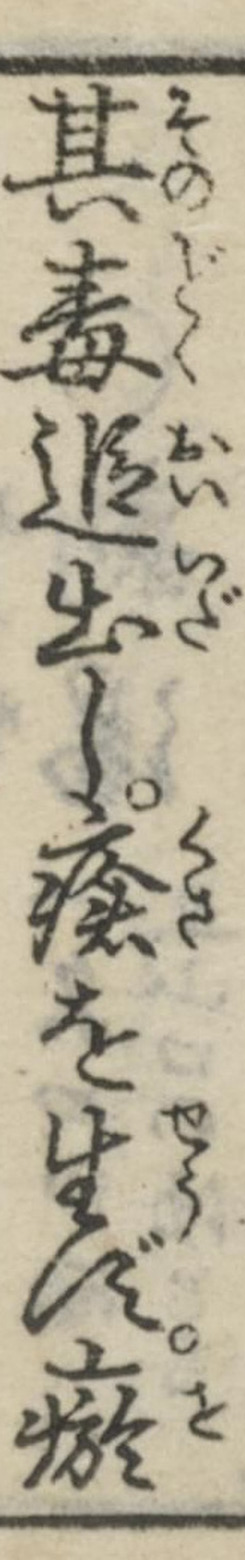其毒追し。瘡を生ず。悪
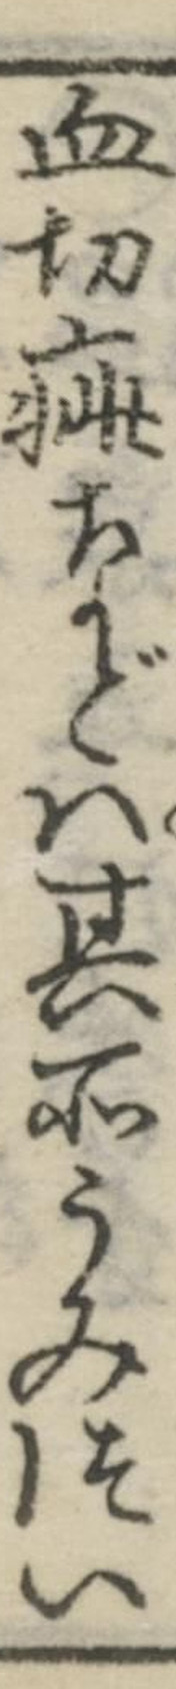血切疵などは。其所うみつい
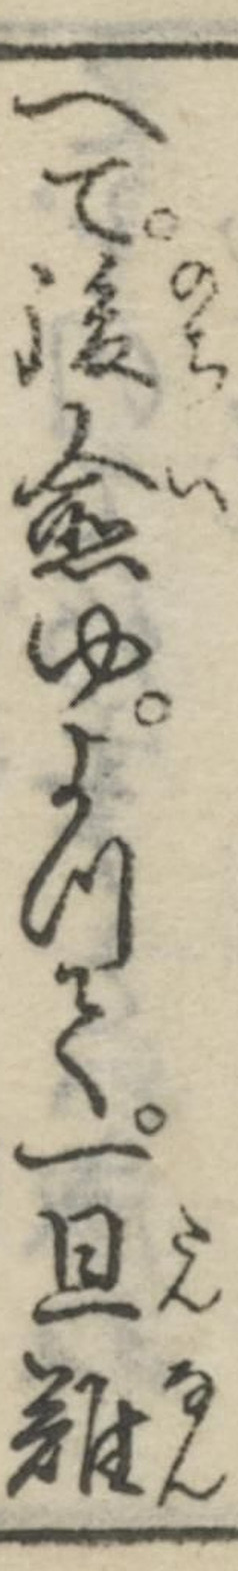へて。後癒ゆ。よつて。一旦難
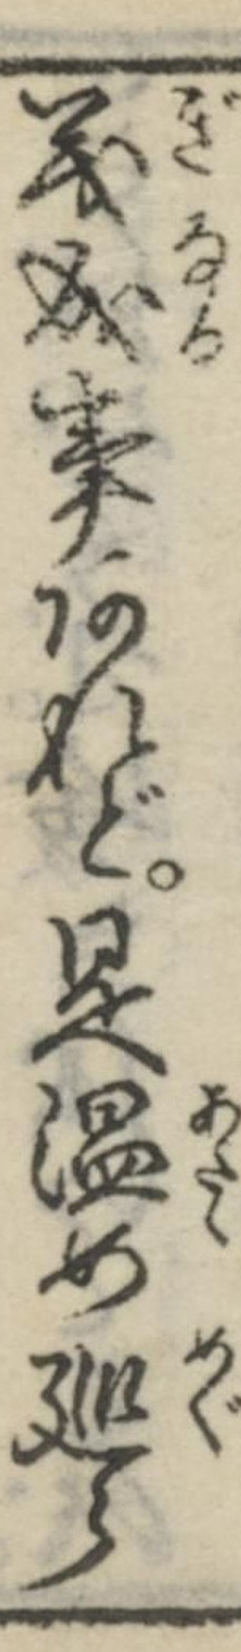義成事あれど。足温め巡ら
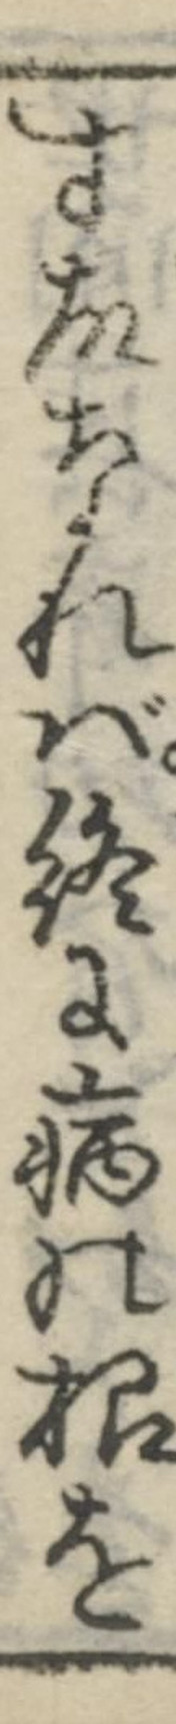す故なれば。終に病の根を
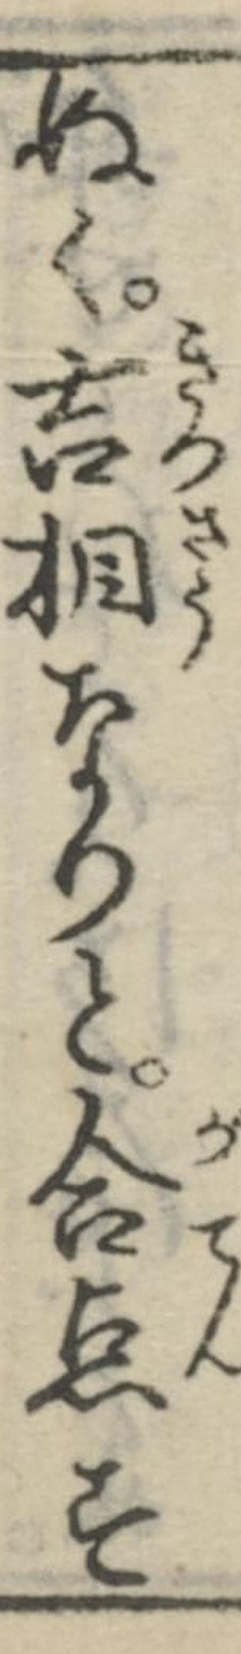ぬく。吉相なりと。合点す
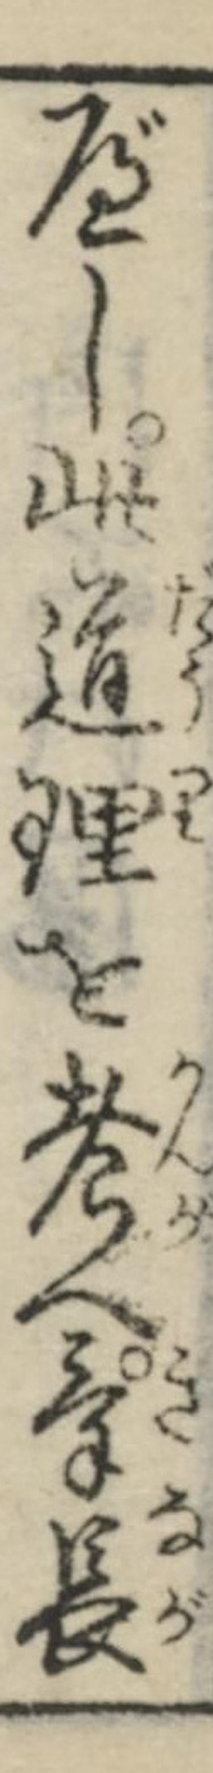べし。此の道理を考へ。気長
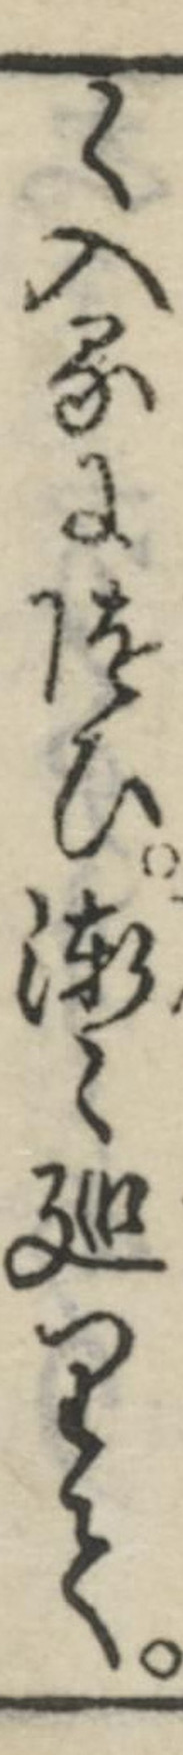く入るに従ひ。漸々巡りて。
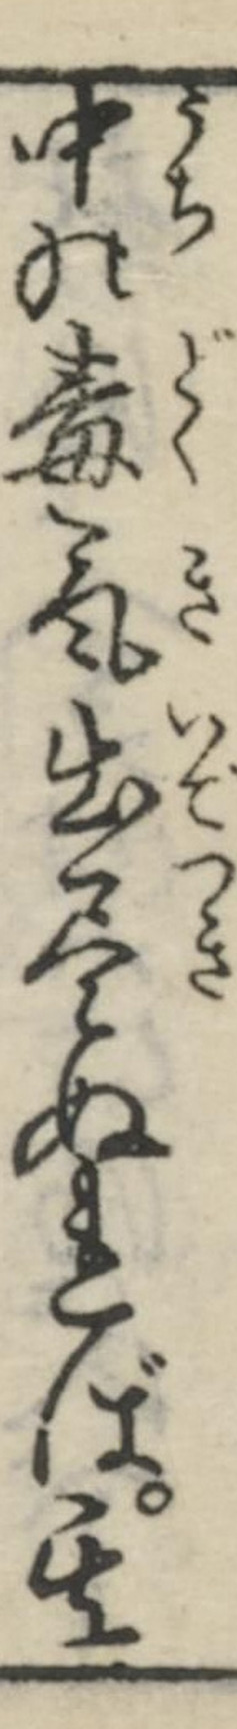中の毒気出尽ぬれば。其
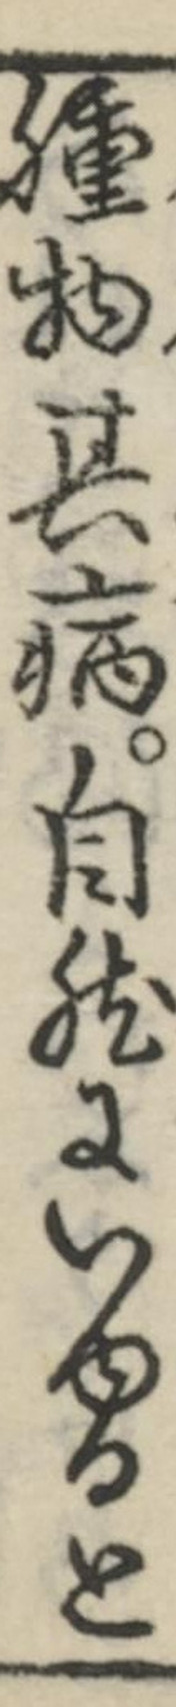種物其病。自然にいゆると
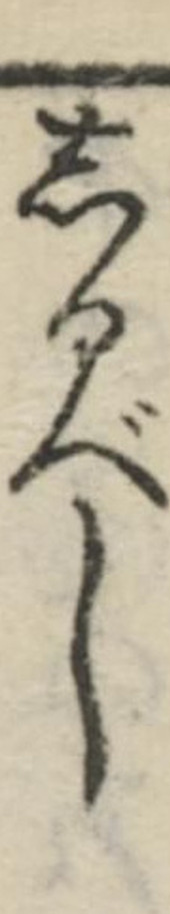しるべし
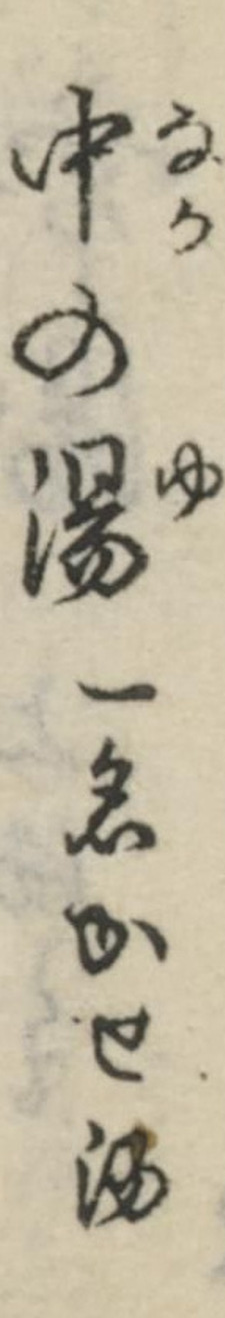中の湯一名かせ湯
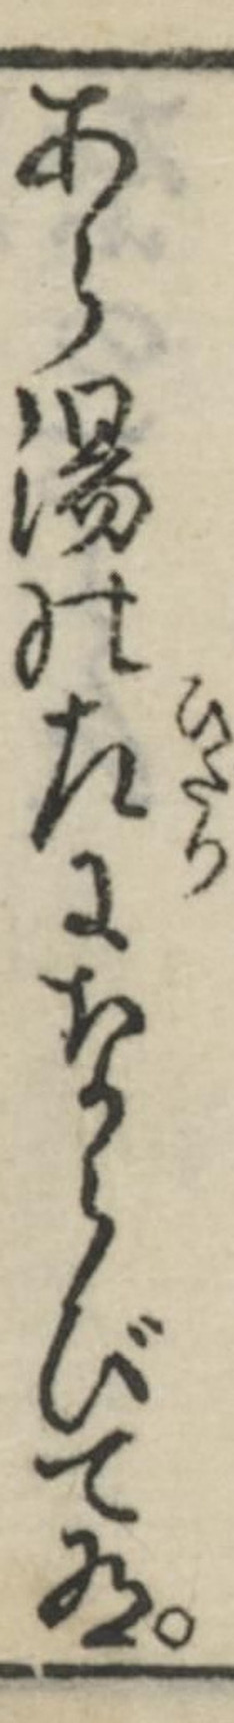あら湯の左にならびて有。
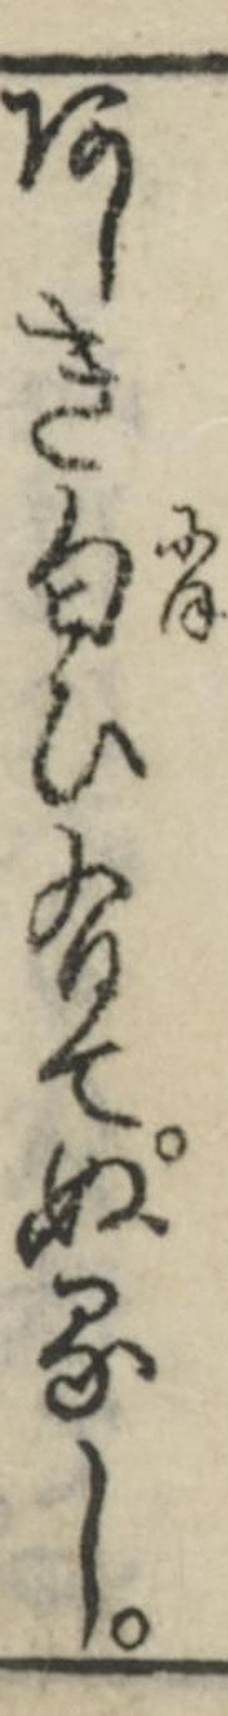あしき匂ひ有て。ぬるし。
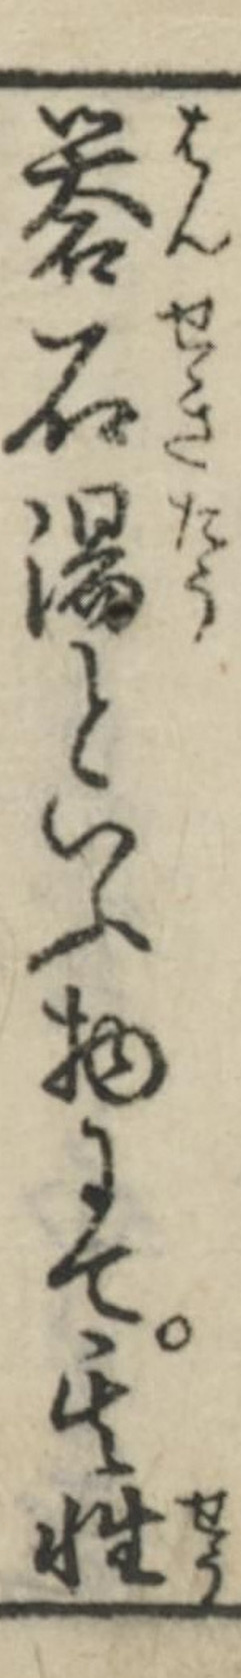礜石湯といふ物にて。性
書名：但州城崎浴湯辧
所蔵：東京大学地震研究所図書室 Earthquake Research Institute Library, The University of Tokyo, JAPAN
